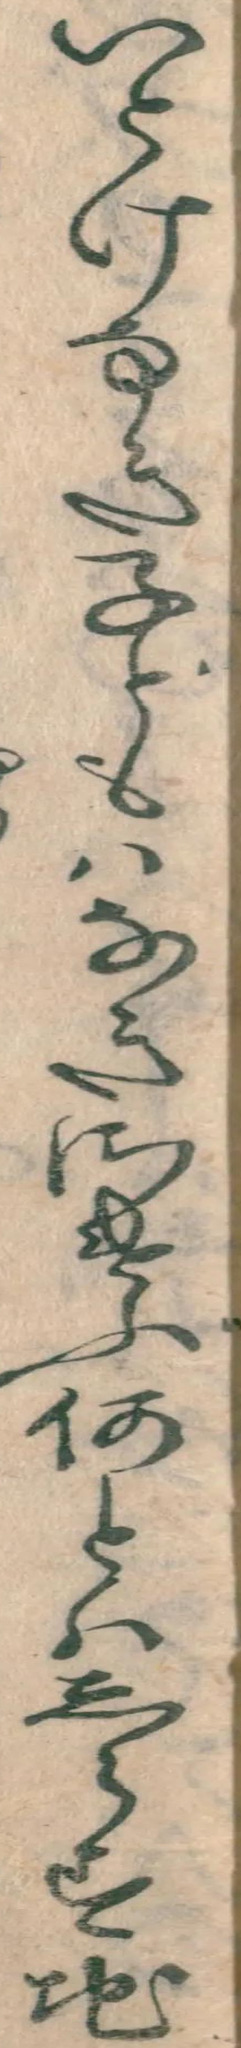いとけなき子どもはなきさけぶ何とはしらす地
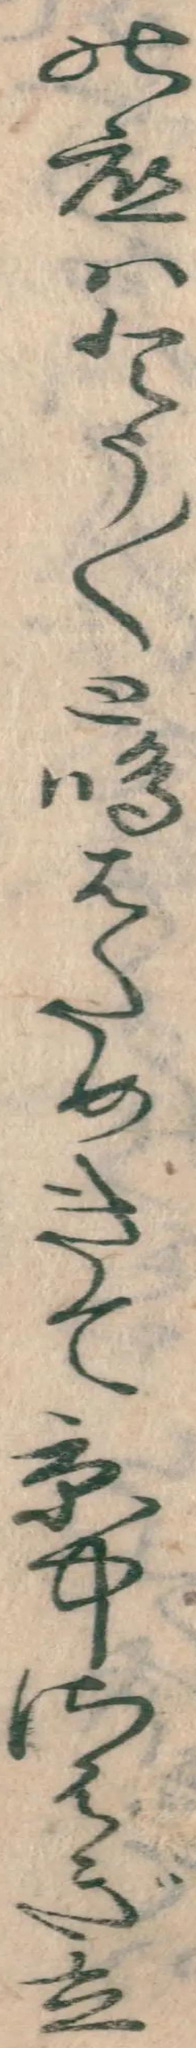の底はどう〳〵と鳴はためきて京中さはぎ立
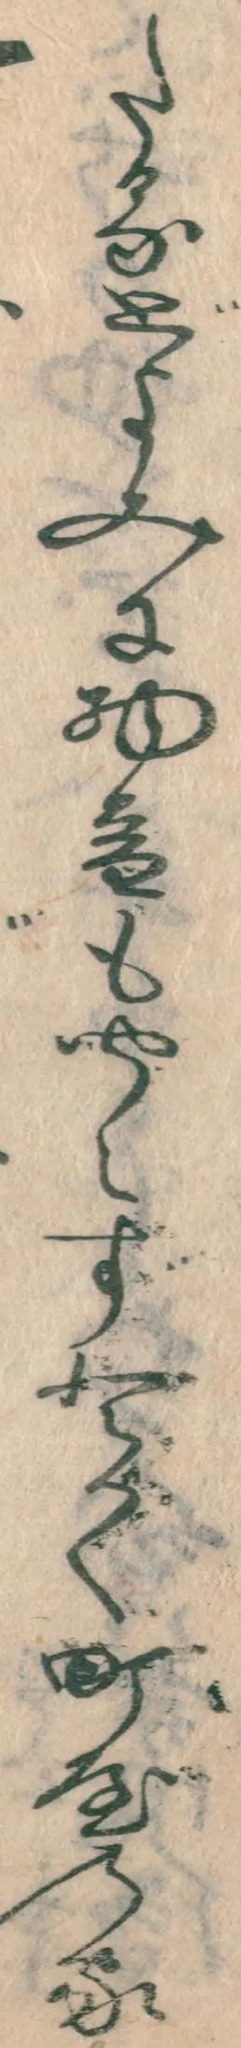たるどよみに物音も聞えずとかく町屋の家
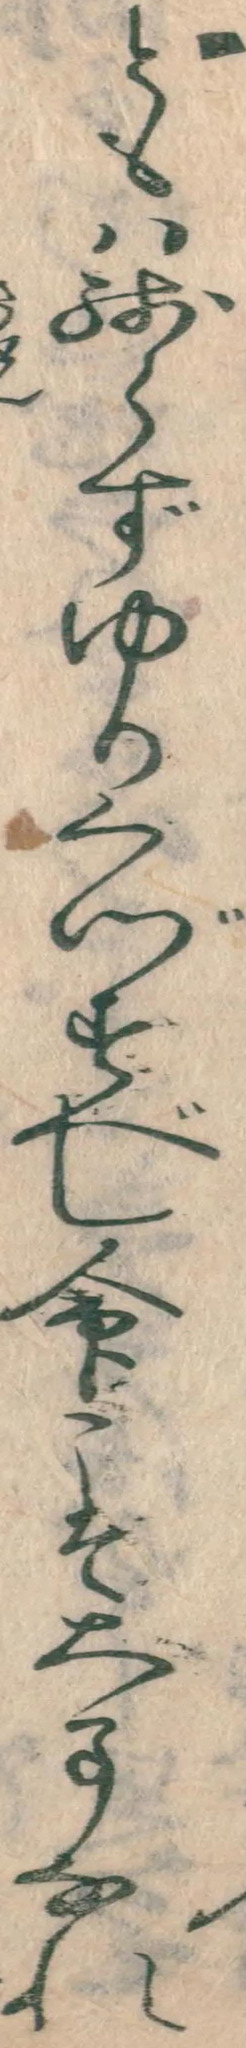ともは残らずゆりくづすべし命こそ大事なれ
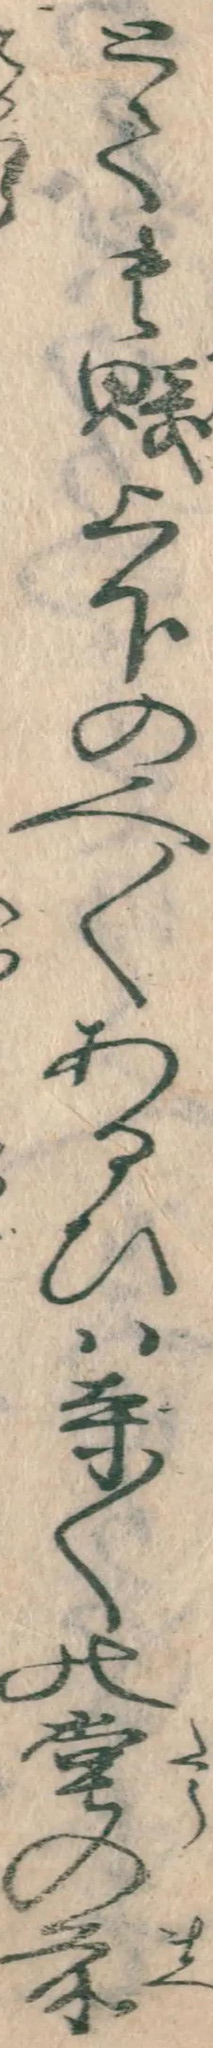とて貴賤上下の人〳〵あるひは寺〳〵の堂の前
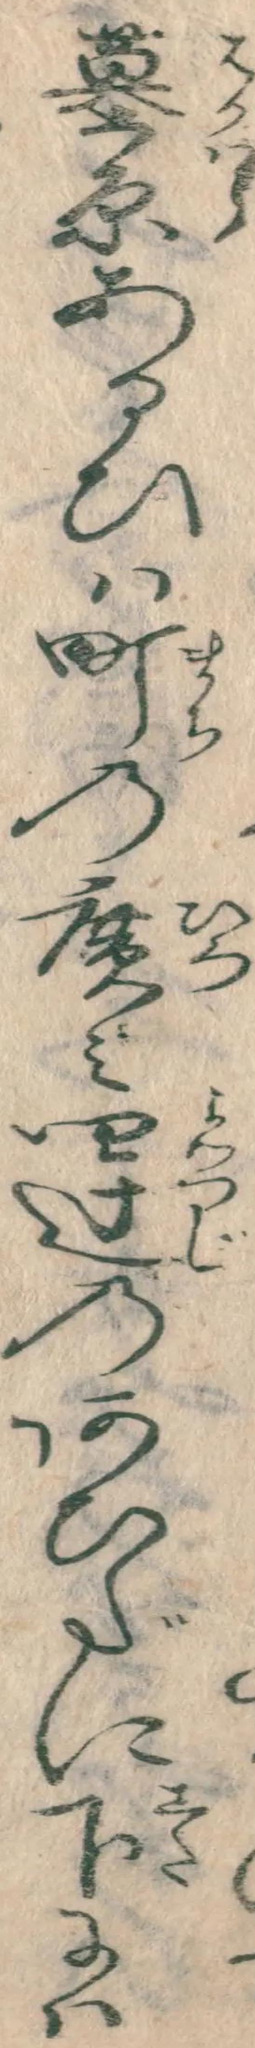墓原あるひはまち町の廣み四辻のあひだに下には
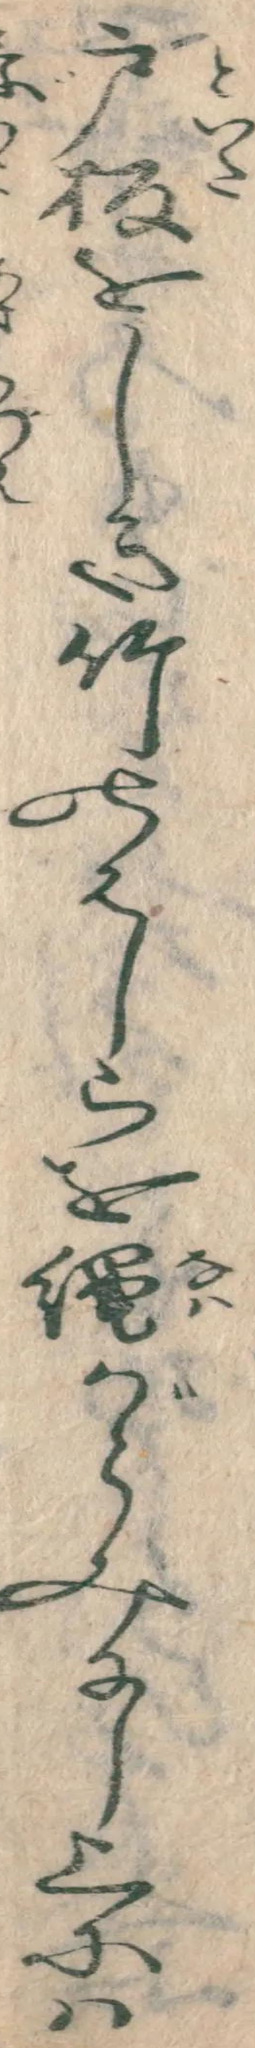戸板をしき竹のはしらを縄がらみにし上には
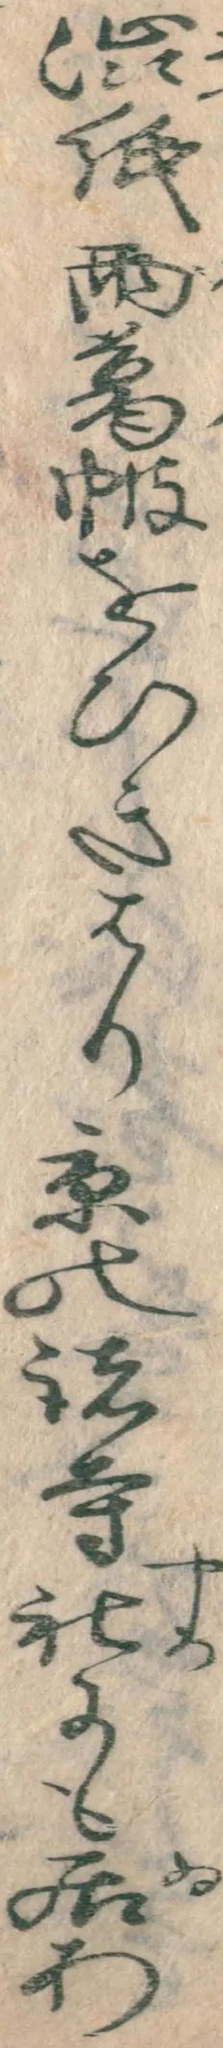渋紙雨葛帔をひきはり京の諸寺社にも居あ
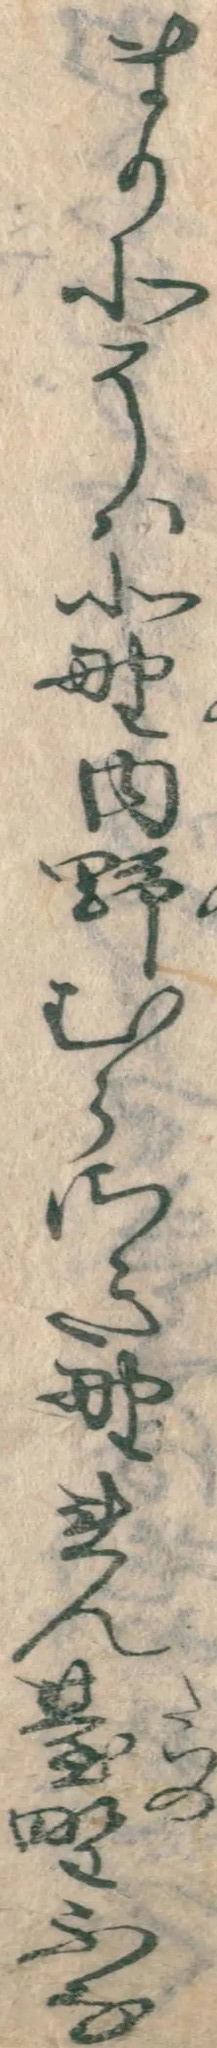まり北には北野内野むらさき野れん臺野ふな
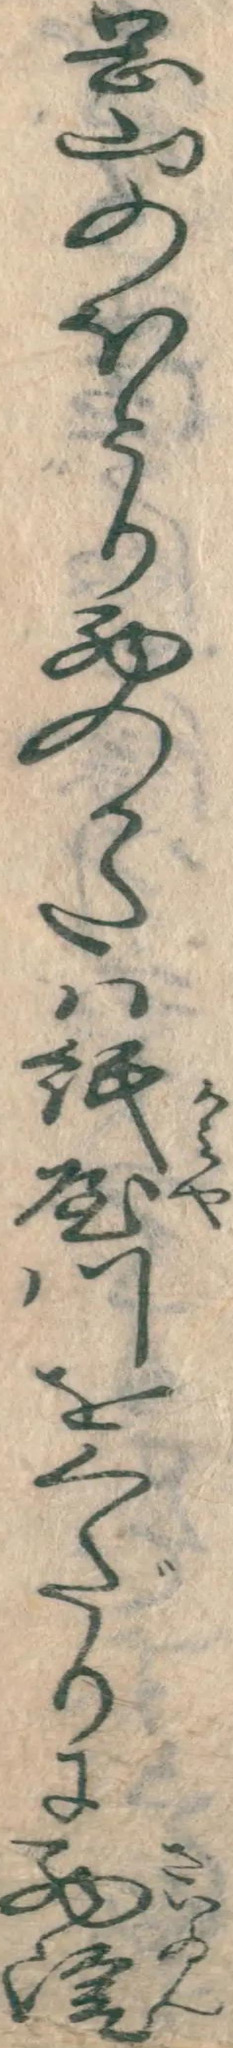岡山のほとり西のかたは紙屋川をくだりに西院
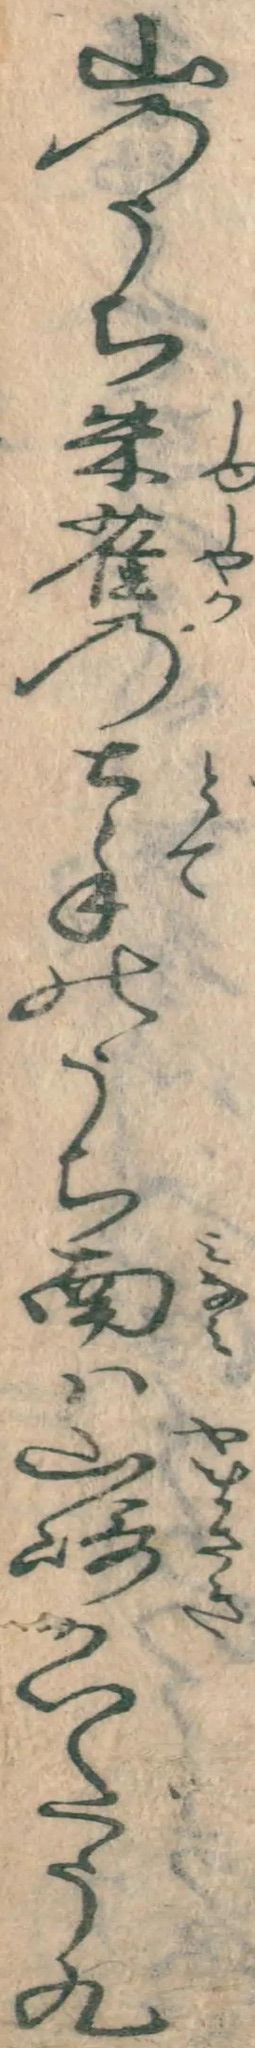山のうち朱雀の土手のうち南は山崎かいたう九

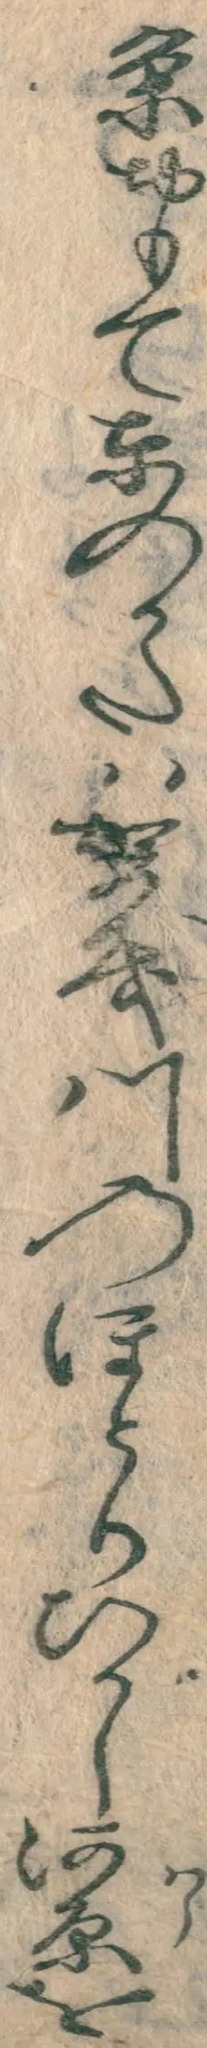条おもて東のかたは賀茂川のほとりひがし河原を
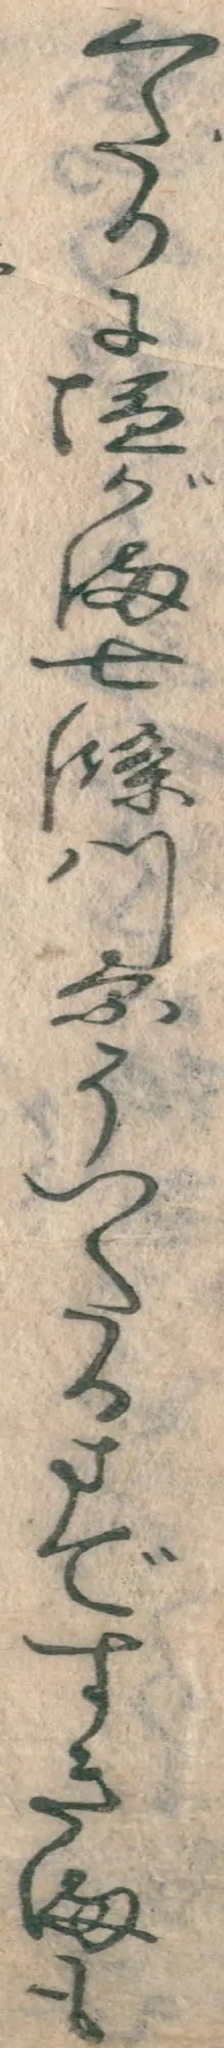くたりに塩がま七條川原にいたるまですきまも
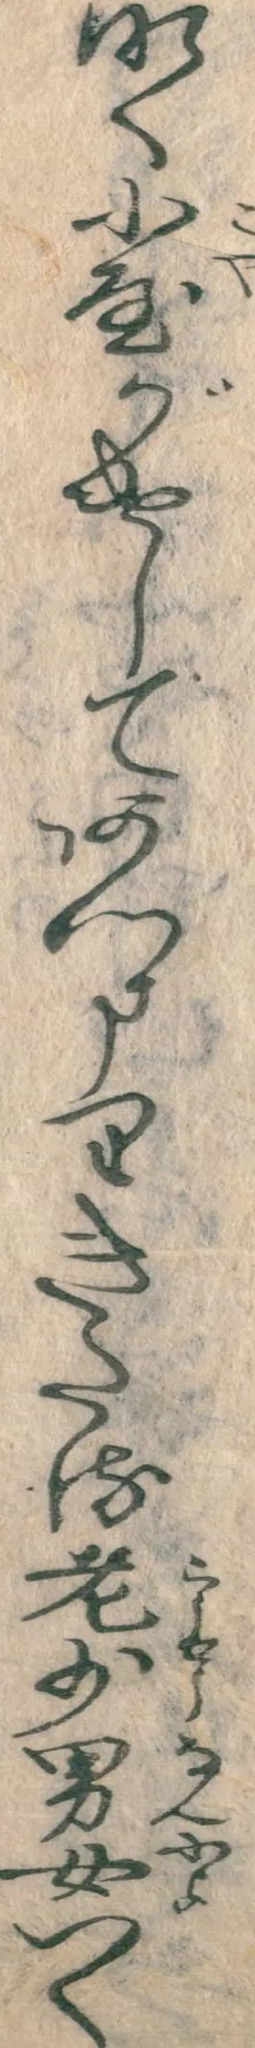なく小屋がけしてあつまりきたる老少男女いく
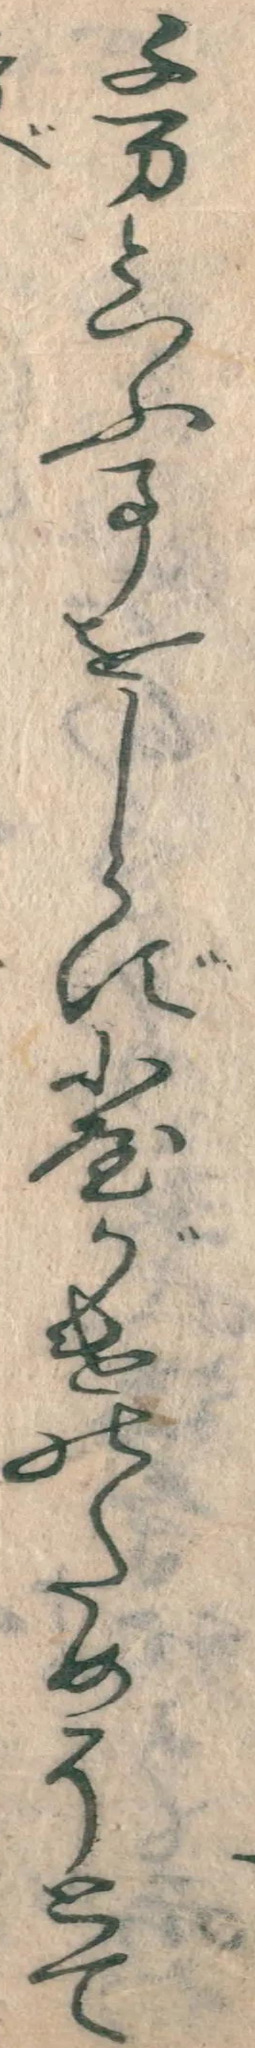千万といふ事をしらず小屋がけのためそとて
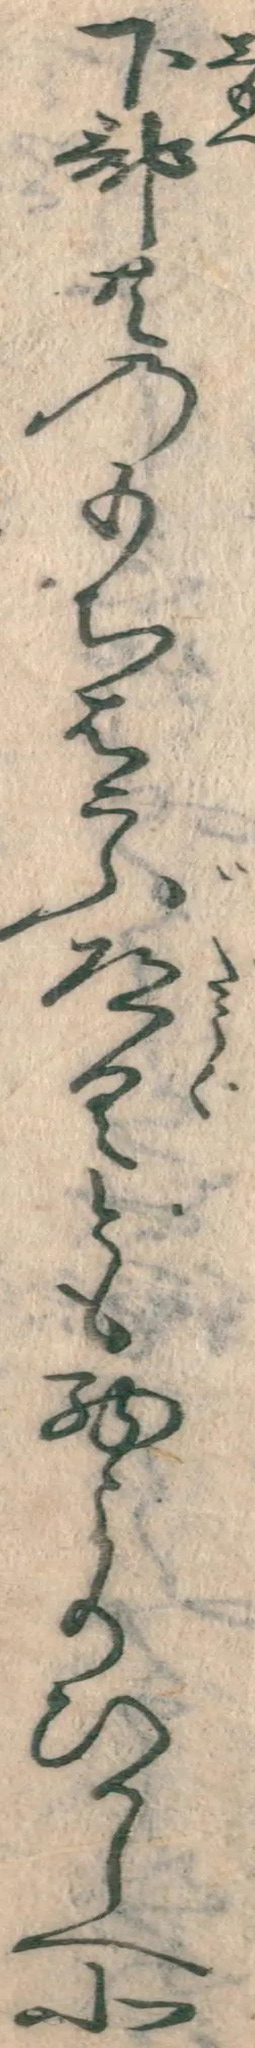下部共のもちはこぶ道具とも西よりひかしへ北
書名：艱難目異志. 上,下
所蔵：国立国会図書館 National Diet Library, JAPAN
